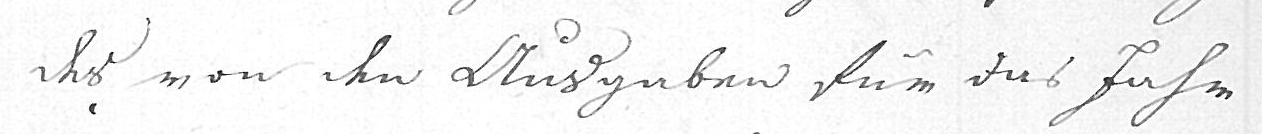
des von den Ausgaben für das Jahr
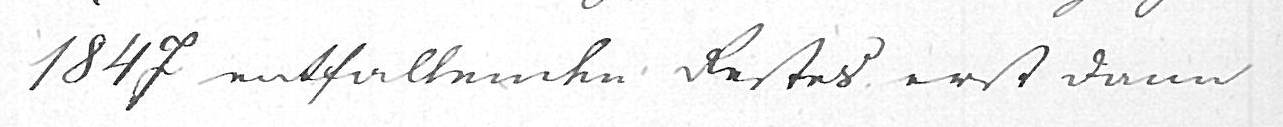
1847 entfallenden Restes erst dann
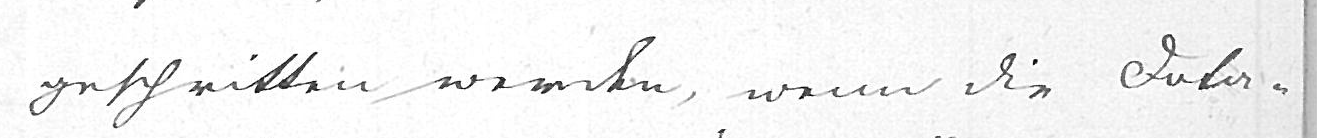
geschritten werden, wenn die Dota-
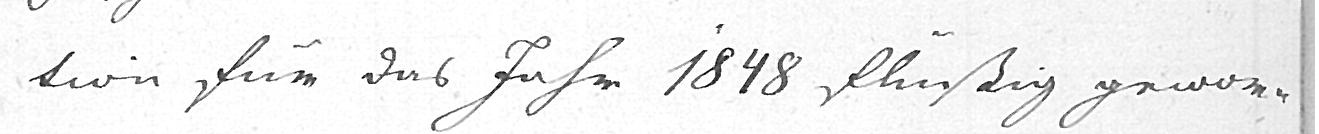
tion für das Jahr 1848 flüßig gewor-
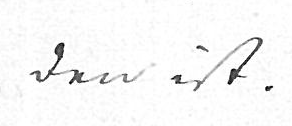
den ist.
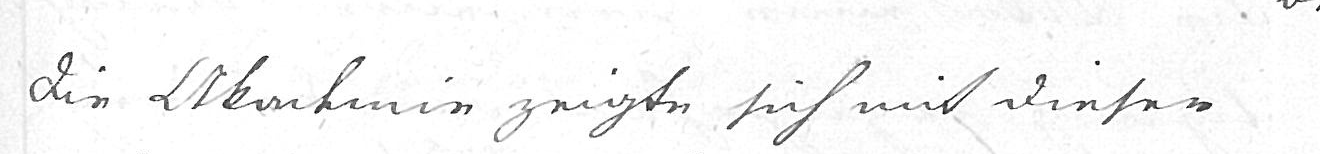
Die Akademie zeigte sich mit dieser
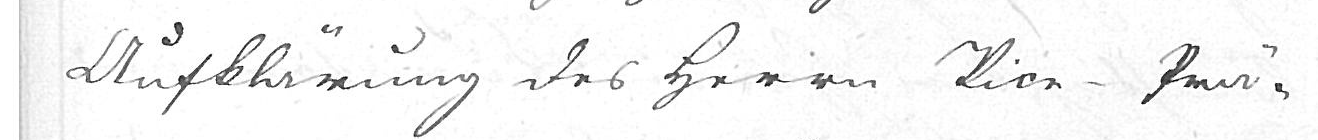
Aufklärung des Herrn Vice-Prä-
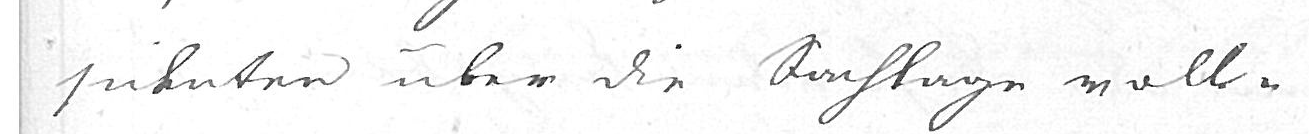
sidenten über die Sachlage voll-
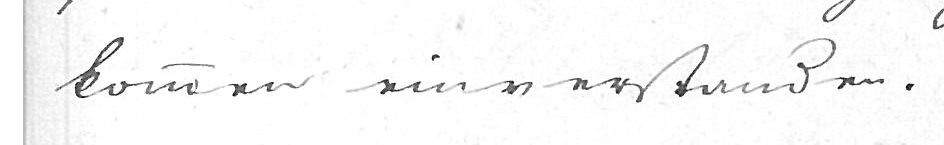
kommen einverstanden.
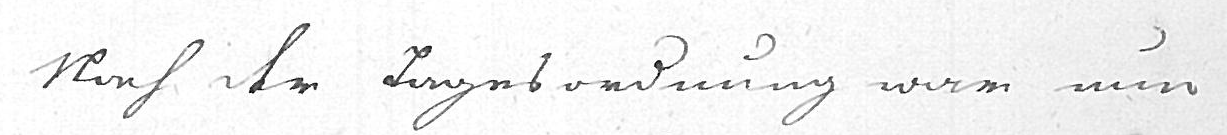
Nach der Tagesordnung war nun
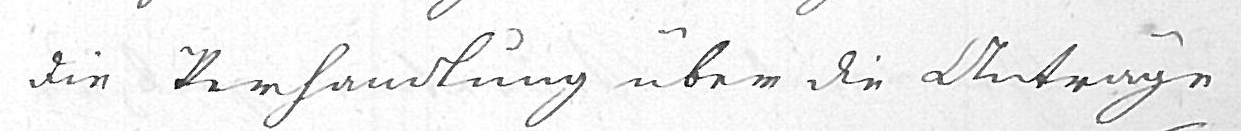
die Verhandlung über die Anträge
